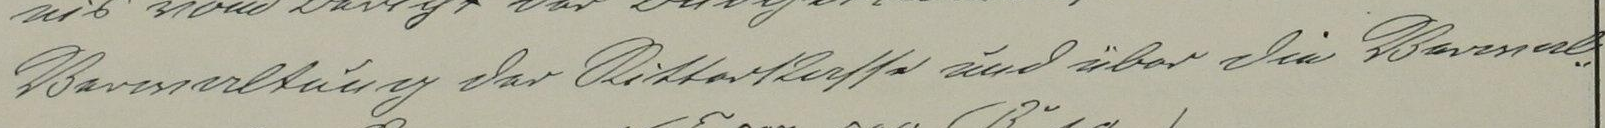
Verwaltung der Ritterkasse und über die Verwal-
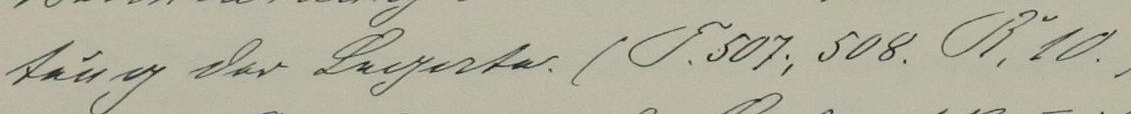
tung der Legate. (T.507; 508. R.10.)
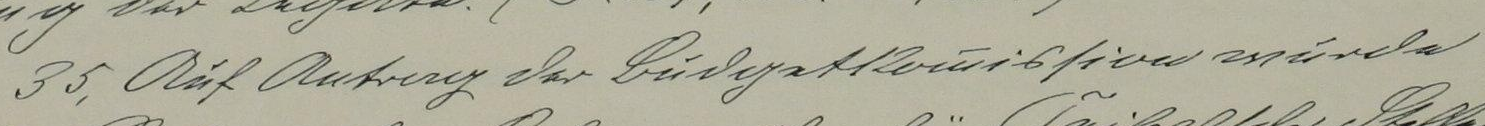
35. Auf Antrag der Budgetkommission wurde
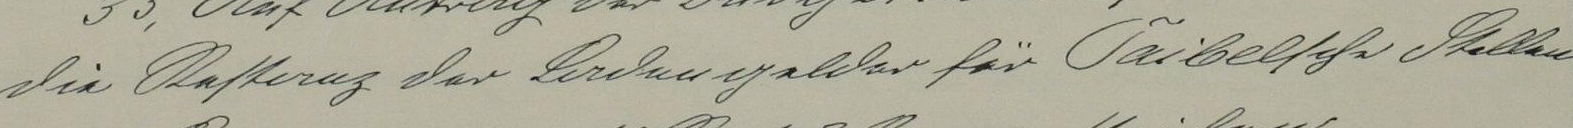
die Restanz der Ladengelder für Taibelsche Stellen
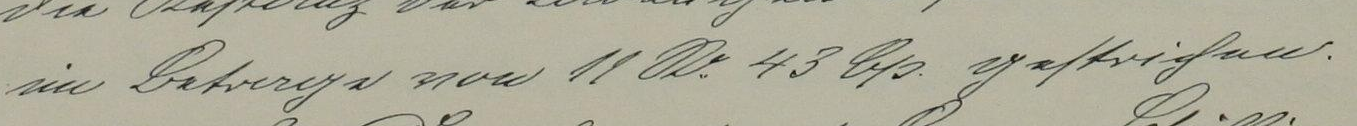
im Betrage von 11 Ro. 43 Cop. gestrichen.
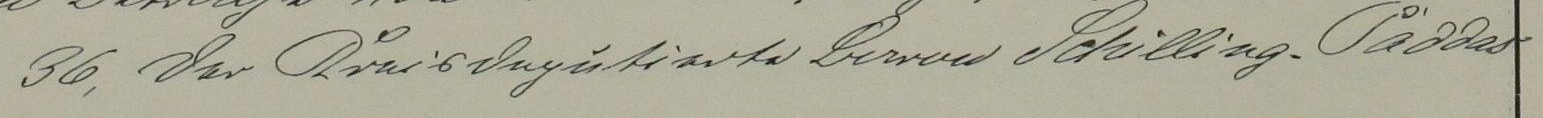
36. Der Kreisdeputierte Baron Schilling-Paddas
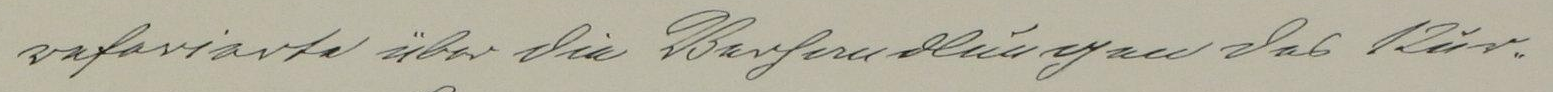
referierte über die Verhandlungen des kur-
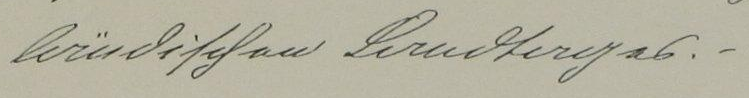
ländischen Landtages.
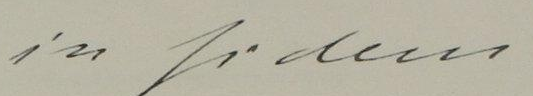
in fidem
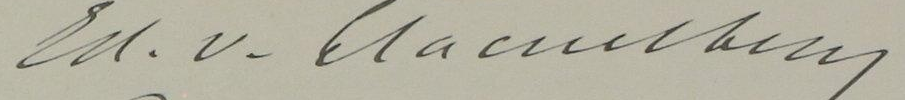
Ed. v. Stackelberg
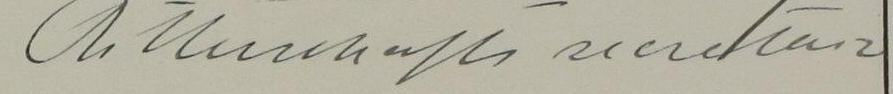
Ritterschafts secretair
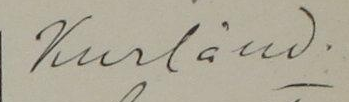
Kurländ.
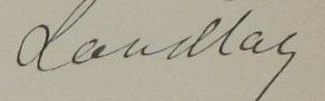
Landtag
